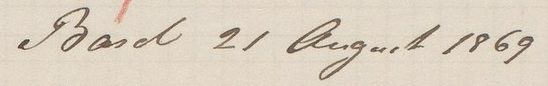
Basel, 21 August 1869
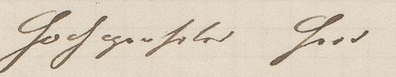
Hochgeehrter Herr
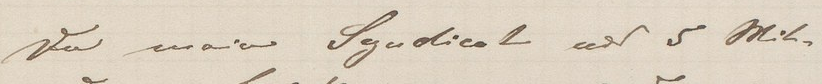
Da mein Syndicat aus 5 Mit-
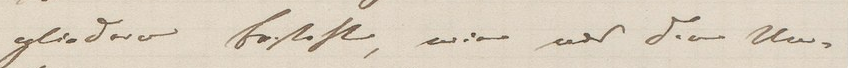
gliedern besteht, wie aus den Un-
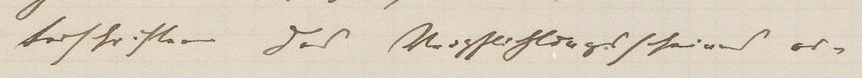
terschriften des Verpflichtungsscheines er-
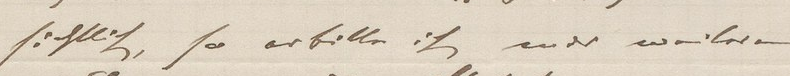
sichtlich, so erbitte ich mir weitere
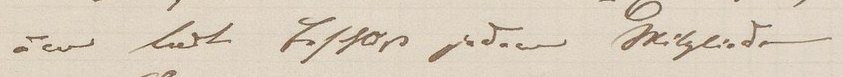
um laut Beschluß jedem Mitgliede
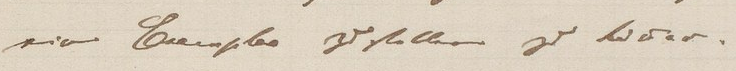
ein Exemplar zustellen zu können.
